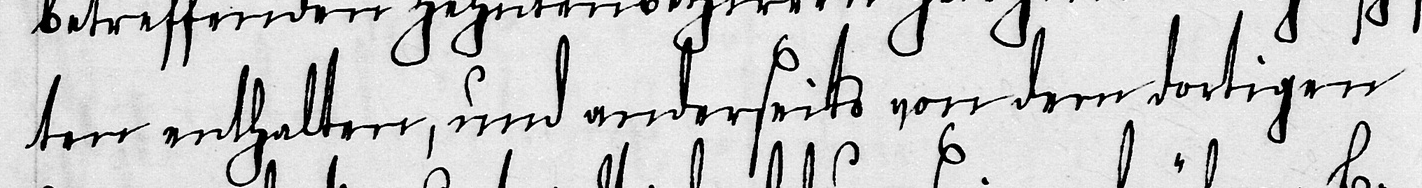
ten enthalten, und anderseits von dem dortigen
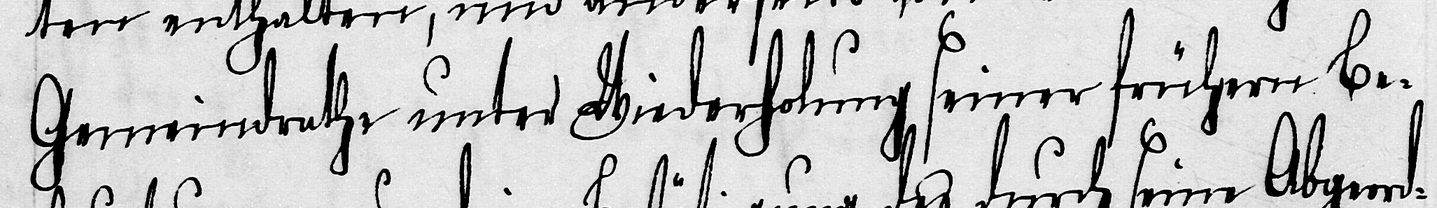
Gemeindrathe unter Wiederholung seiner frühern Be¬
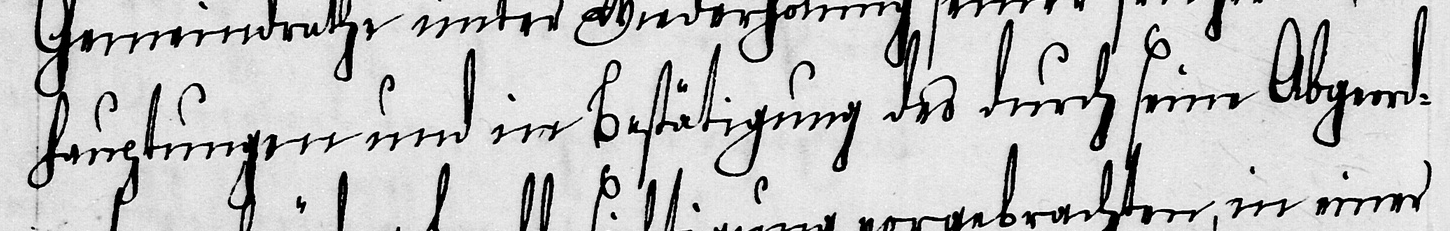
hauptungen und in Bestätigung des durch seine Abgeord¬
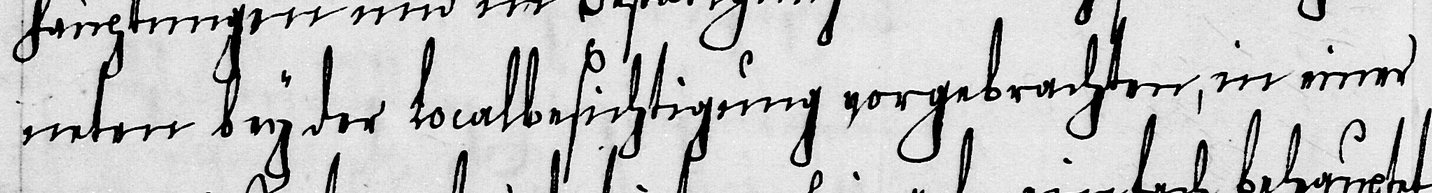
neten bey der Localbesichtigung vorgebrachten, in einer
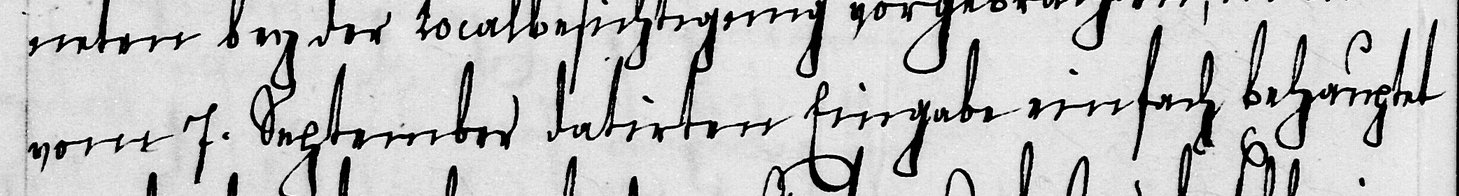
vom 7. September datirten Eingabe einfach behauptet
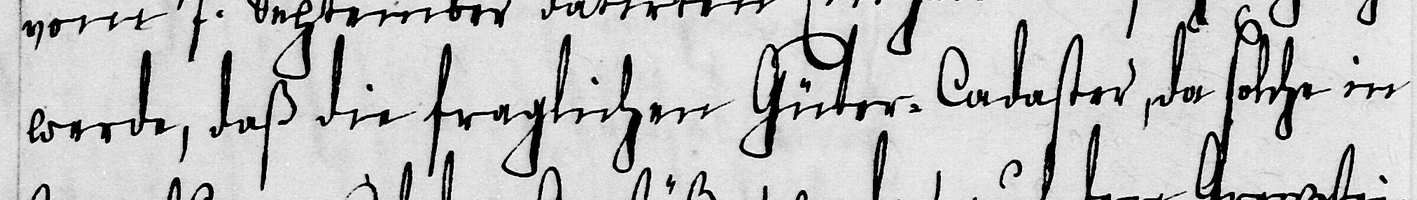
werde, daß die fraglichen Güter-Cadaster, da solche
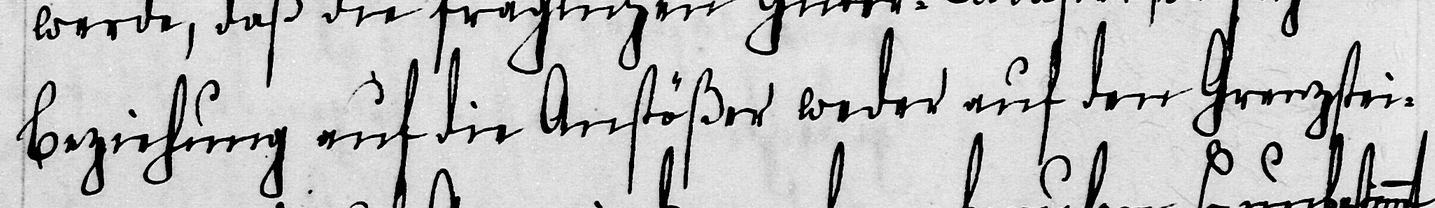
Beziehung auf die Anstößer weder auf den Grenzstei¬
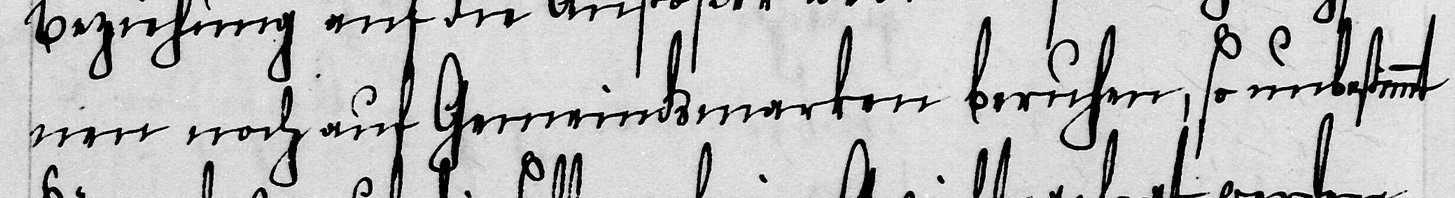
nen noch auf Gemeindsmarken beruhen, so unbest¬
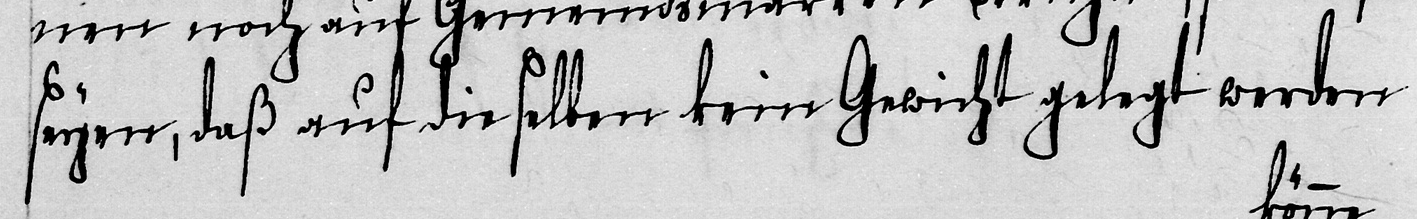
seyen, daß auf dieselben kein Gewicht gelegt werden
